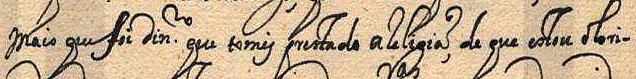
mais que foi din.ro que tomej prestado a Religiaõ, de que estou obri
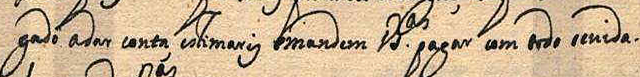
gado a dar conta, estimarej o mandem Vs.as pagar com todo o cuida
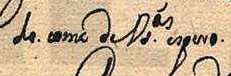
do como de Vs.as espero.
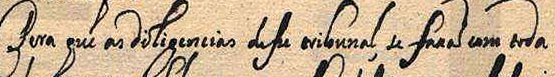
Pera que as diligencias desse tribunal, se farā com toda
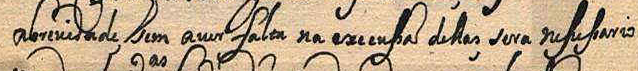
a breuidade, sem auer falta na execussā dellas, sera nessessario
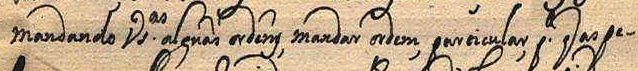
mandando Vs.as alguās orden̄s, mandar ordem, particular, p.a q̄ as pe
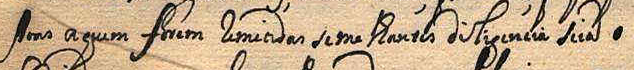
ssoas a quem forem Remetidas semelhantes diligencia seiā o
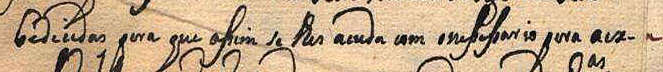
bedicidas, pera que assim se lhes acuda com o nessessario pera a ex
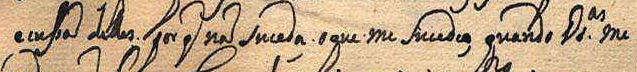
ecussā delles, por q̄ naõ suceda, o que me sucedeo, quando Vs.as me
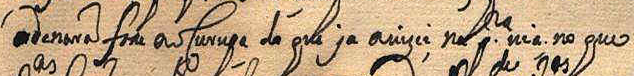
ordenarā fose ao Curupa do que ja auizei, na p.ra uia; no que
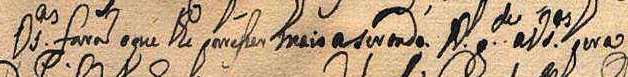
Vs.as faraõ o que lhe paresser mais asertado. Ds. g.de a Vs.as pera
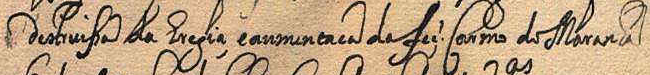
destruissā da Eregia, e aumentaçā da feé; Carmo do Maranhā
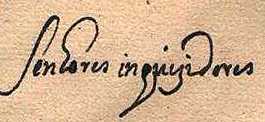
Senhores inquizidores
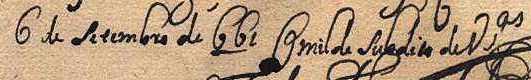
6 de setembro de 661 Omilde subdito de Vsas
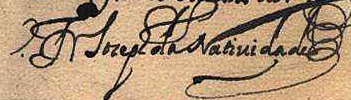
Fr Iozeph da Natiuidade
